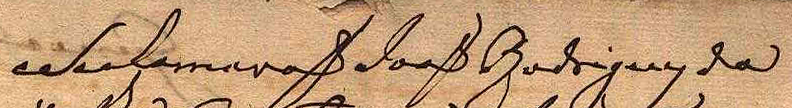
e Se chamavaõ Ioaõ Rodrigues da
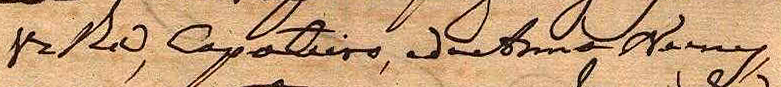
velha, Çapateiro, e de Anna Nunes,
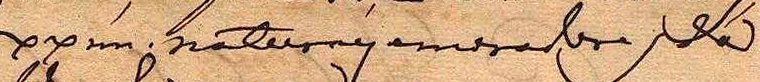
xx nn. naturaes e moradores da
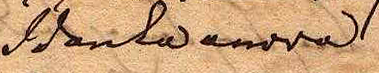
Idanha a nova
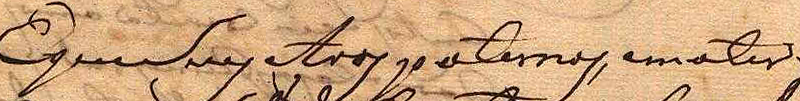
E que seus Avos paternos, e mater
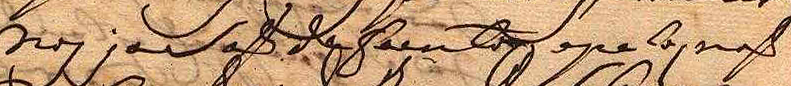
nos ja Saõ defuntos e pelos naõ
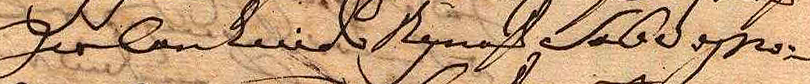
ter Conhecido lhes naõ Sabe os no
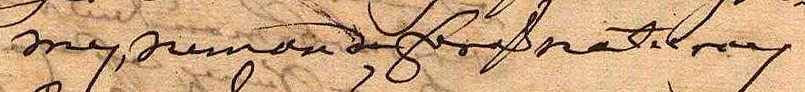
mes, nem onde foraõ naturaes
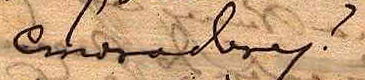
e moradores?
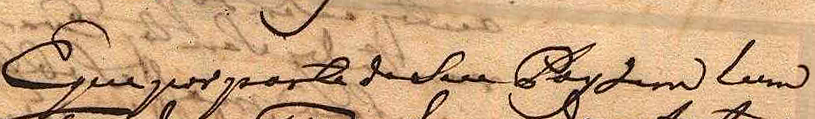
E que por parte de seu Pay tem hum
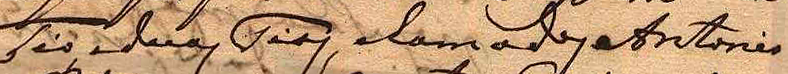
Tio, e duas Tias, e chamados Antonio
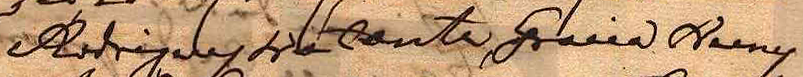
Rodrigues tratante, Gracia Nunes,
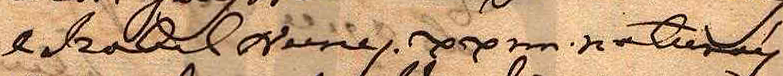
e Izabel Nunes xx nn. naturaes
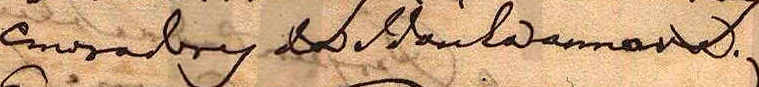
e moradores da Idanha a nnova.
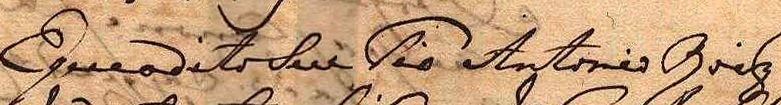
E que o dito Seu Tio Antonio Roiz̄
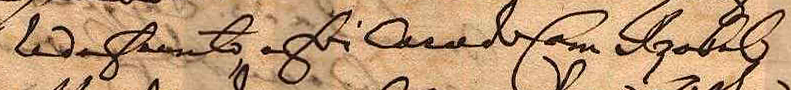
he defunto, e foi Cazado Com Izabel
